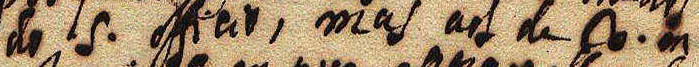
do S. officio, mas aos de v. m.
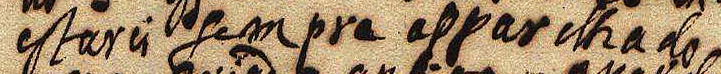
estarei sempre apparelhado
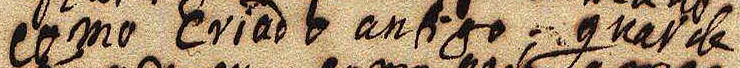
como Criado antigo. guarde
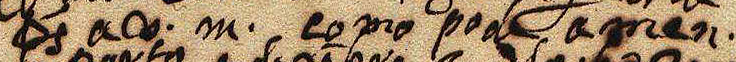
Ds̄ a v. m. como pode amen.
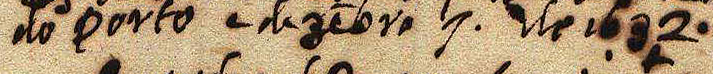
do porto a dezēbro 7. de 1632.
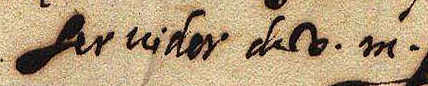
seruidor de v. m.
